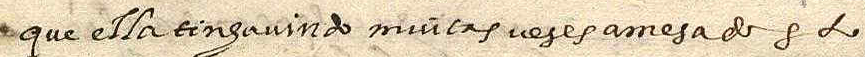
que ella tinha uindo muitas ueses a mesa do sto
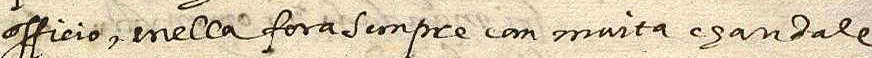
officio, e nella fora sempre com muita charidade
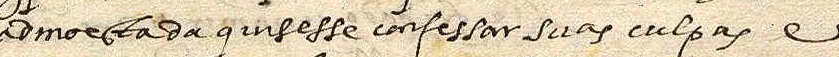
admoestada quisesse confessar suas culpas e
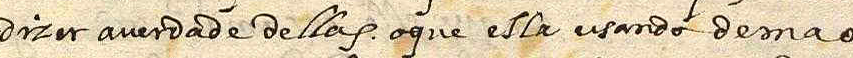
dizer a uerdade dellas o que ella usando de mao
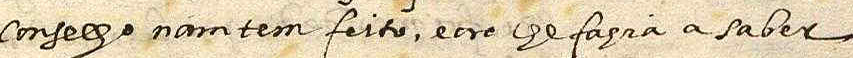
conselho nam tem feito, e cre lhe fazia a saber
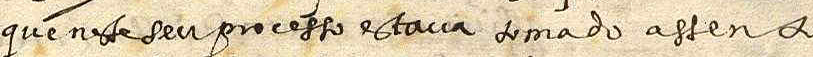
que neste seu processo estaua tomado assento
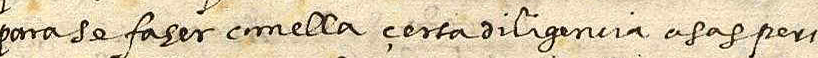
para se fazer com ella çerta diligencia asas peri
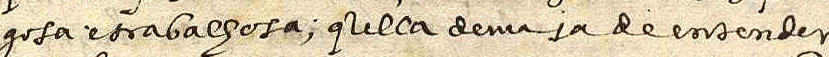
gosa e trabalhosa; q̄ ella deuia ja de entender
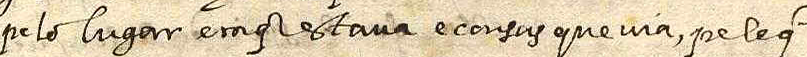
pelo lugar em q̄ estaua e cousas que uia, pelo q̄
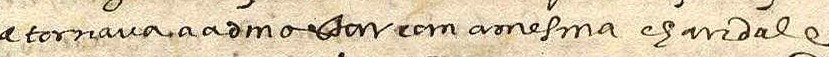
a tornaua a admoestar com a mesma charidade
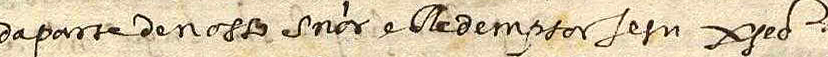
da parte de nosso Snōr e Redemptor Jesu Xpō
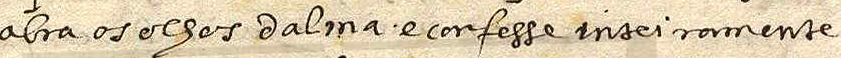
abra os olhos dalma e confesse inteiramente
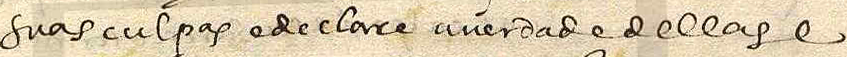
suas culpas e declare a uerdade dellas e
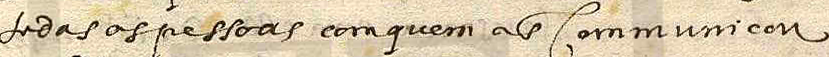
todas as pessoas com quem as Communicou
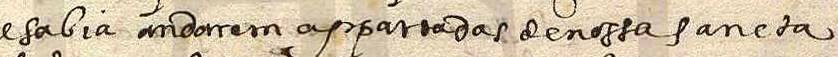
e sabia andarem appartadas de nossa sancta
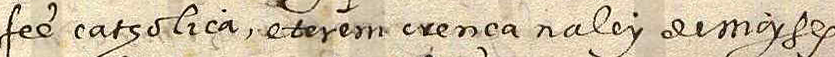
feé catholica, e terem crença na ley de moyses
